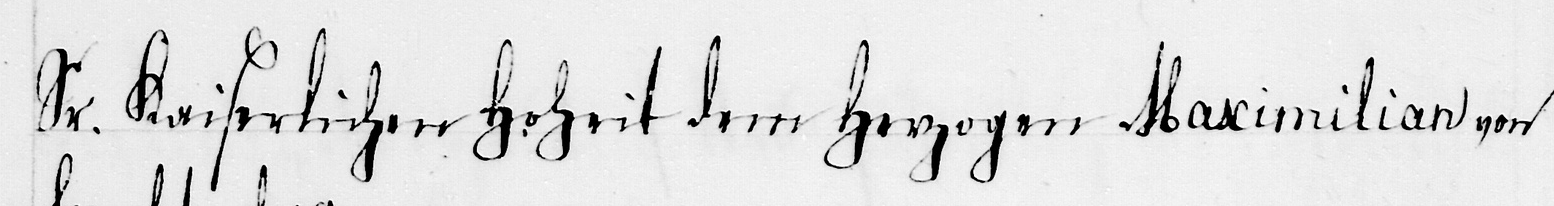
Sr. Kaiserlichen Hoheit dem Herzogen Maximilian von
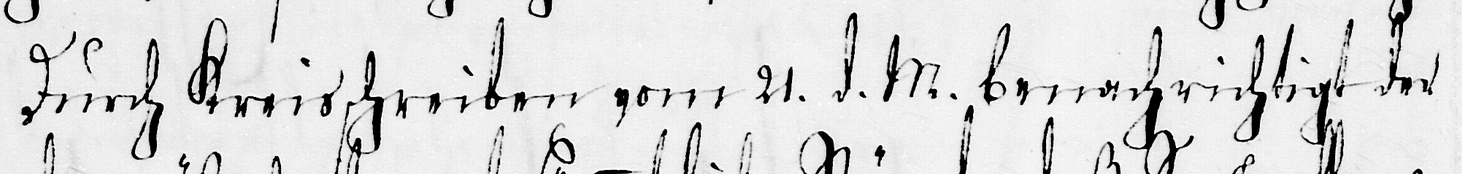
Durch Kreisschreiben vom 21. d. M. benachrichtigt der
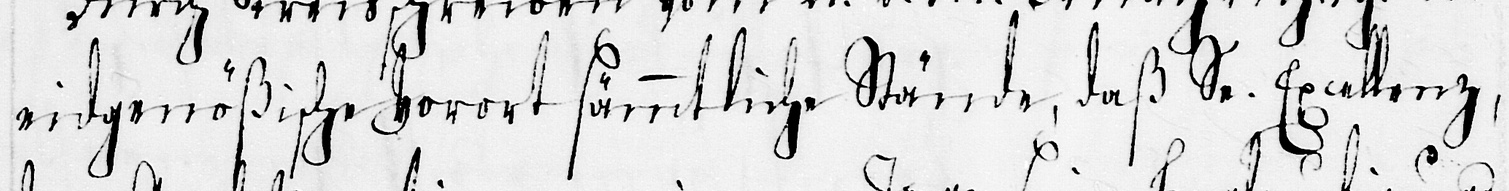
eidgenößische Vorort sämmtliche Stände, daß Se. Excellenz,
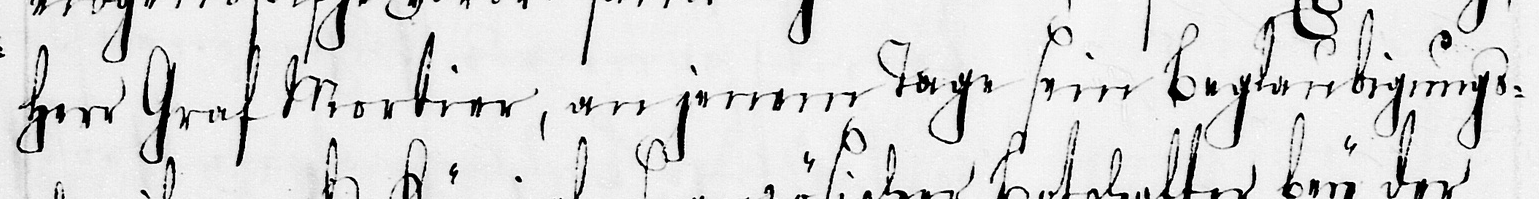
Herr Graf Mortier, an jenem Tage sein Beglaubigungs¬
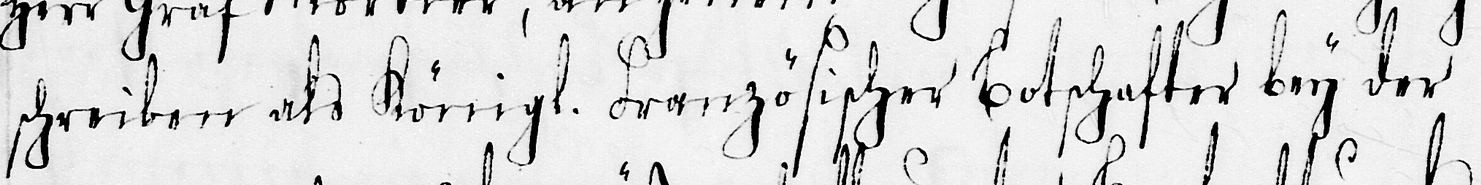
schreiben als Königl. Französischer Botschafter bey der
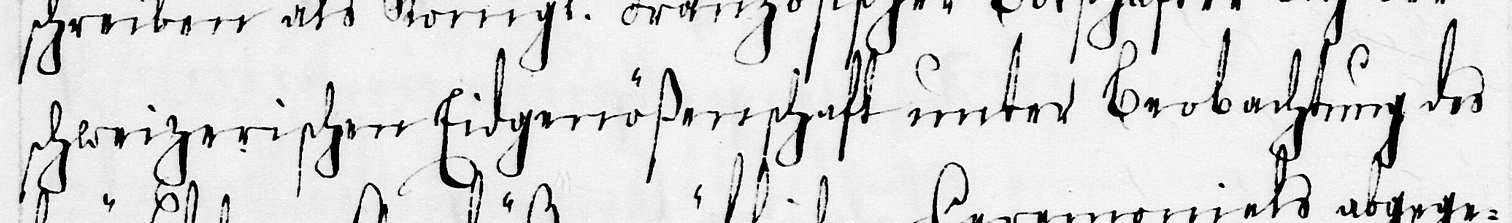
schweizerischen Eidgenößenschaft unter Beobachtung des
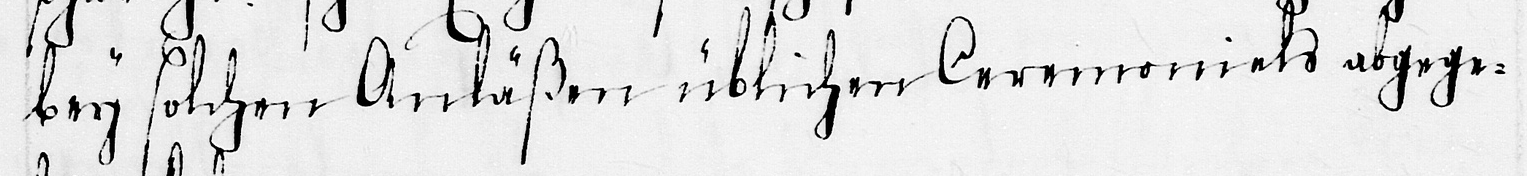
bey solchen Anläßen üblichen Ceremonials abgege¬
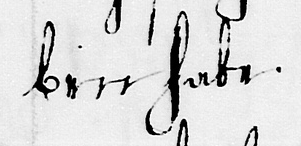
ben habe.
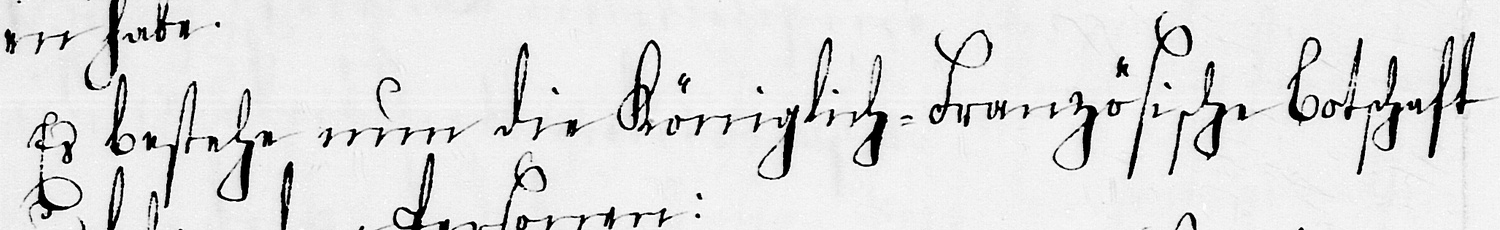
Es bestehe nun die Königlich-Französische Botschaft
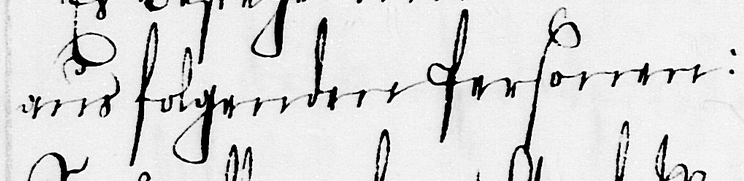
aus folgenden Personen:
